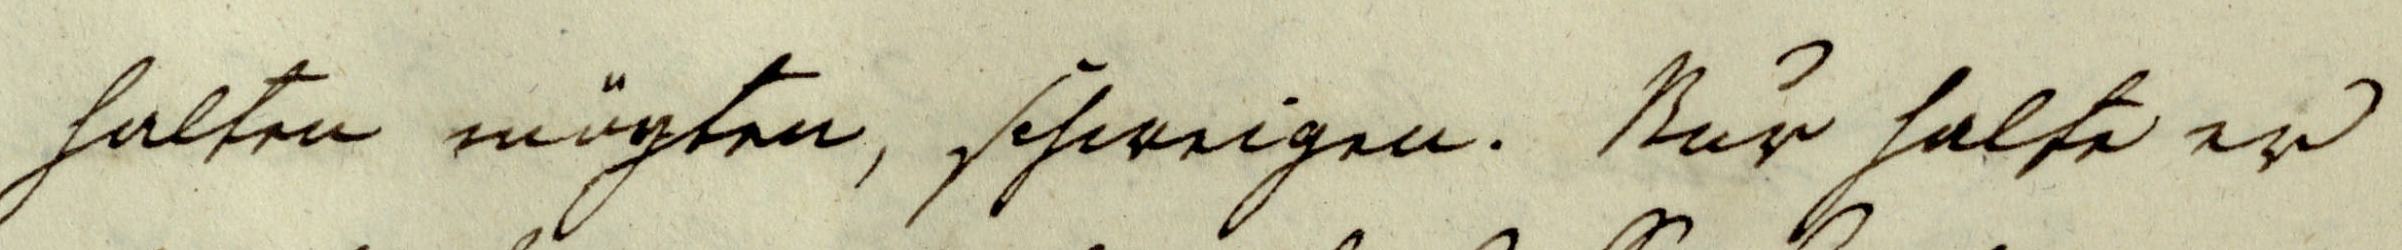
halten mögten, schweigen. Nur halte er
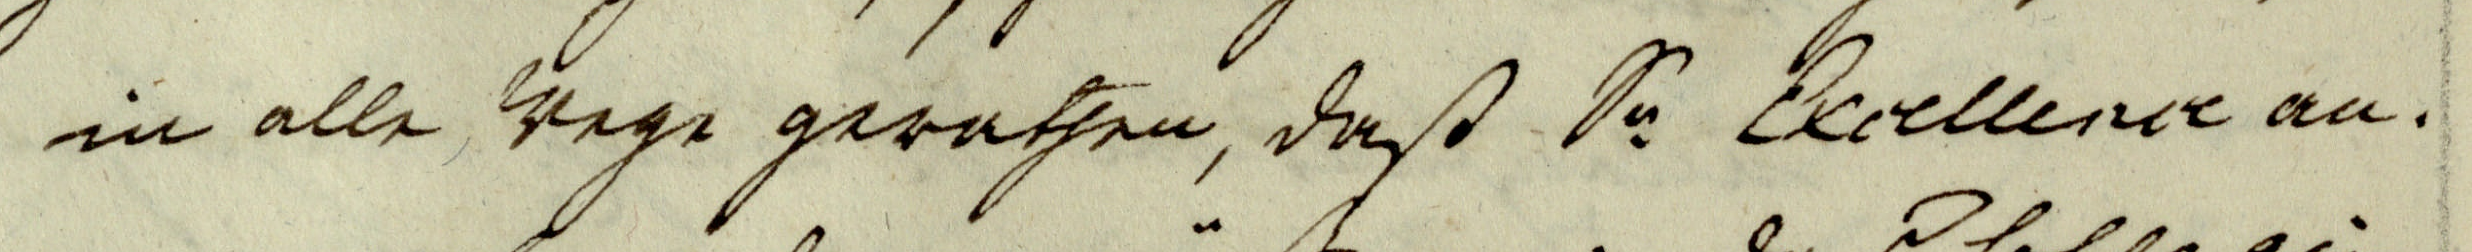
in alle Wege gerathen, daß Sr Excellence an¬
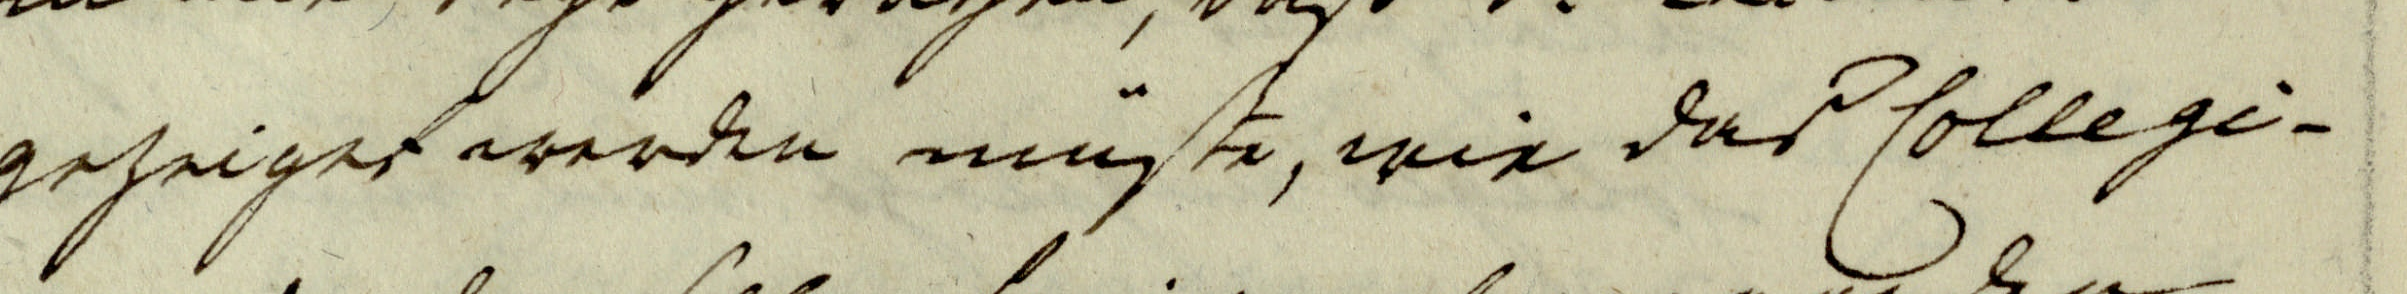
gezeiget werden müßte, wie das Collegi¬
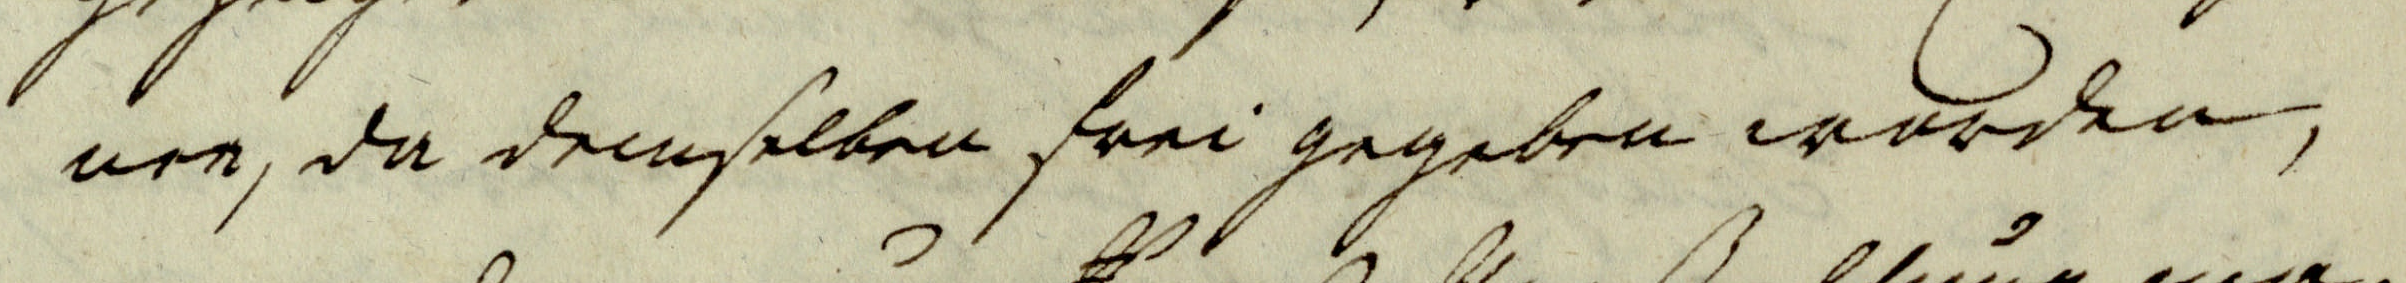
um, da demselben frei gegeben worden,
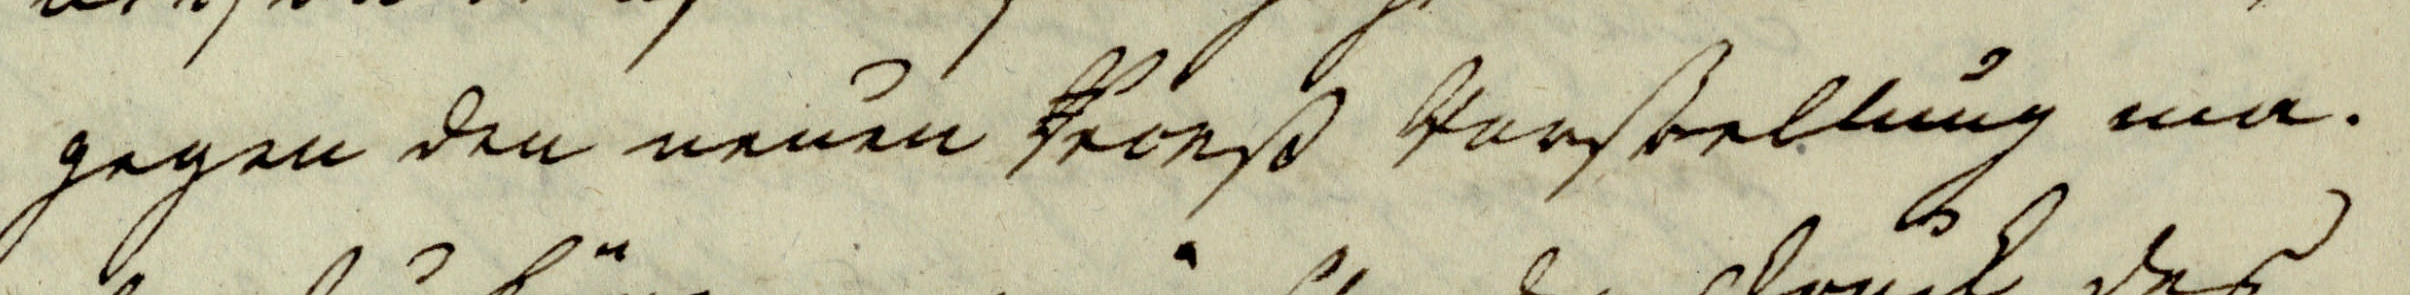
gegen den neuen Receß Vorstellung ma¬
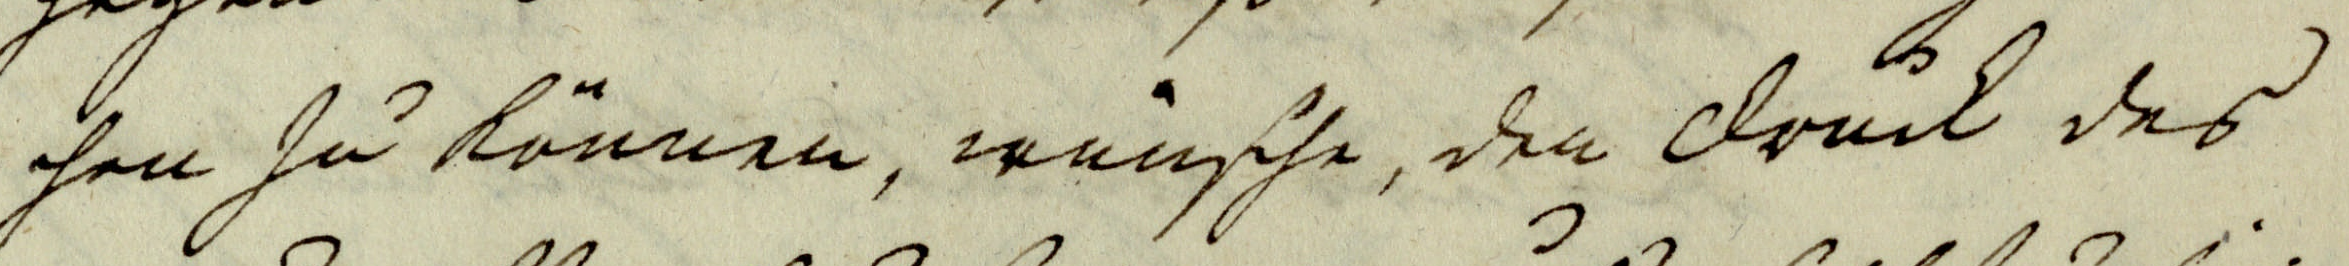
chen zu können, wünsche, den Druck des
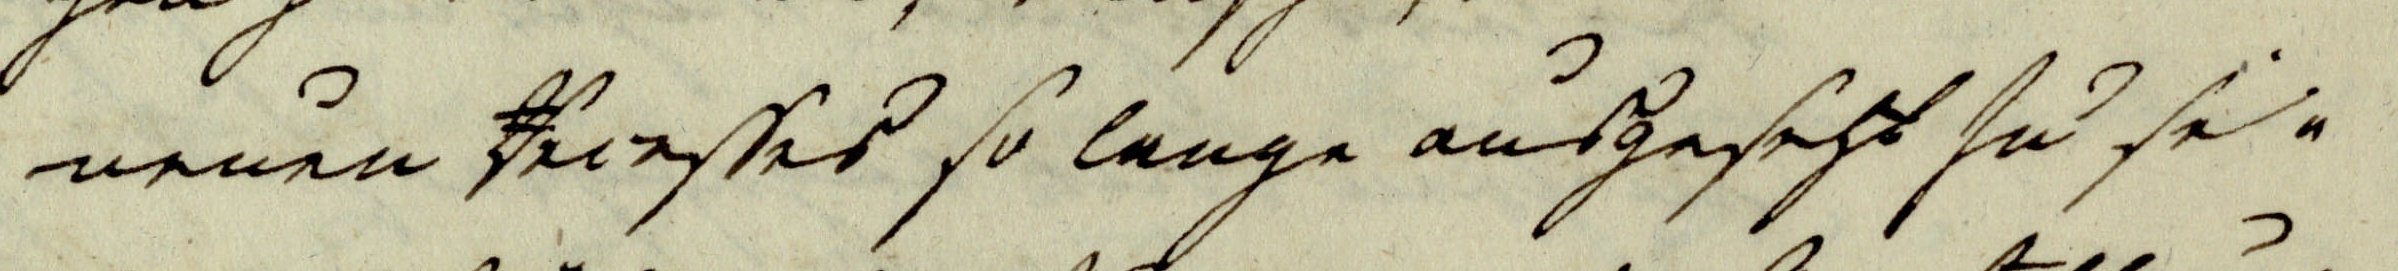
neuen Recesses so lange ausgesetzt zu se¬
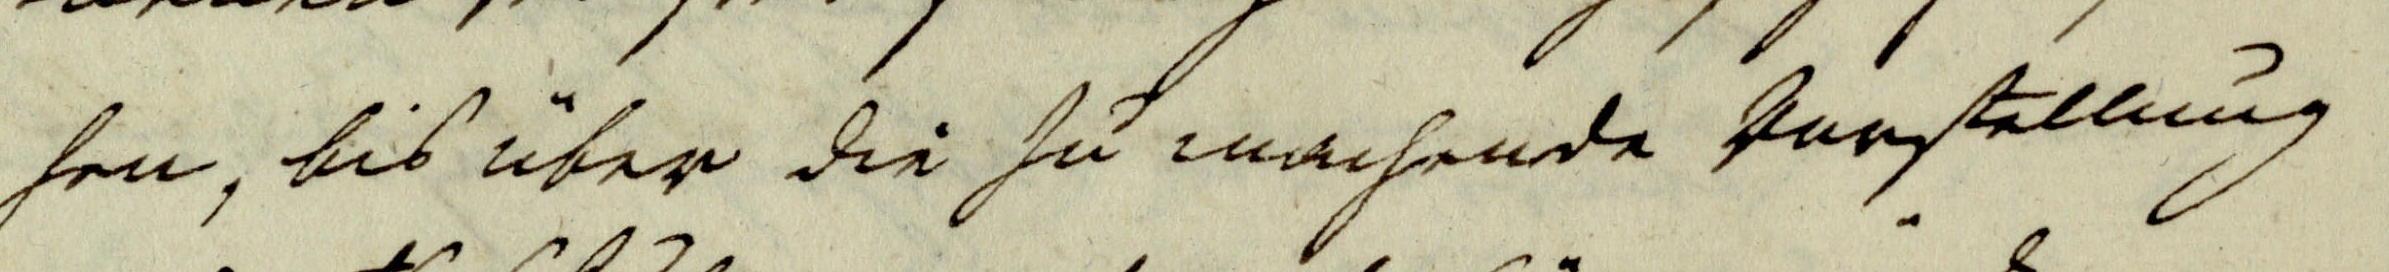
hen, bis über die zu machende Vorstellung
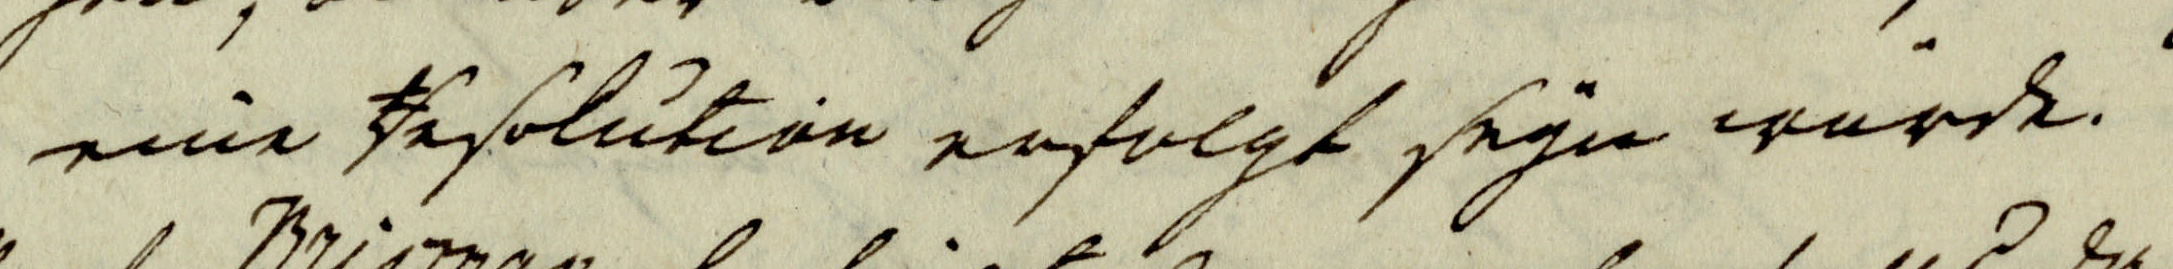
eine Resolution erfolgt seÿn würde.
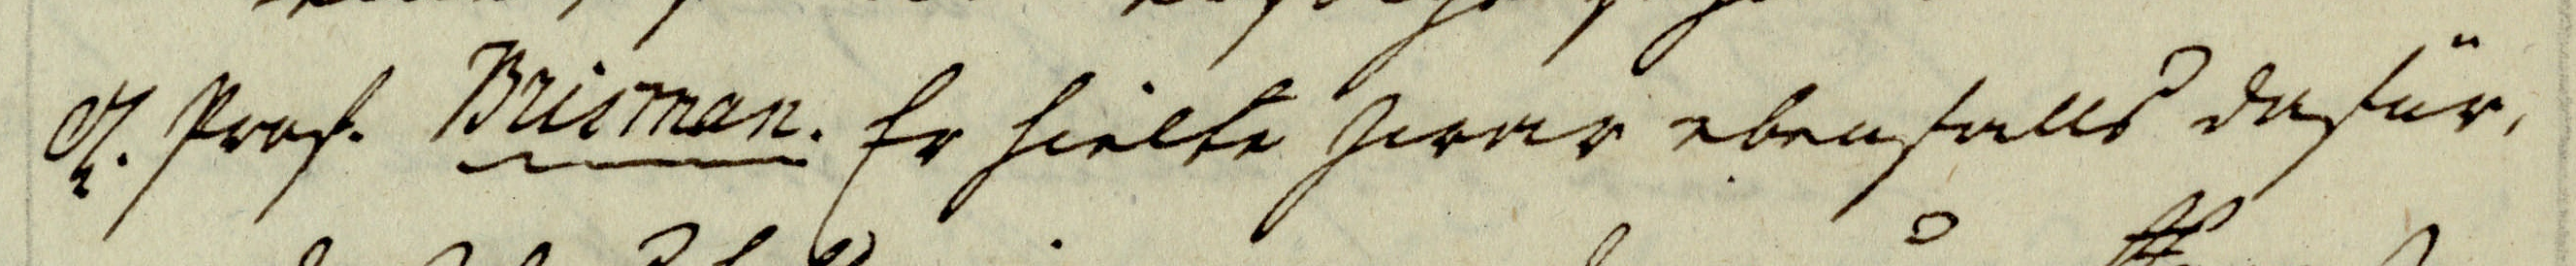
dh. Prof. Brisman. Er hielte zwar ebenfalls dafür¬
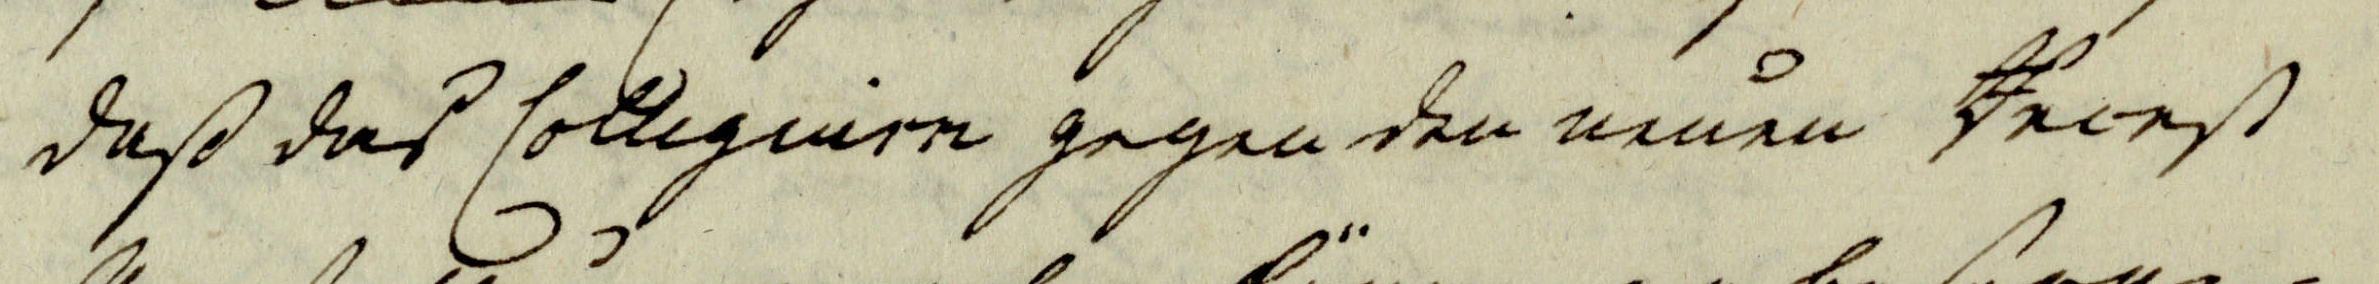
daß das Collegium gegen den neuen Receß
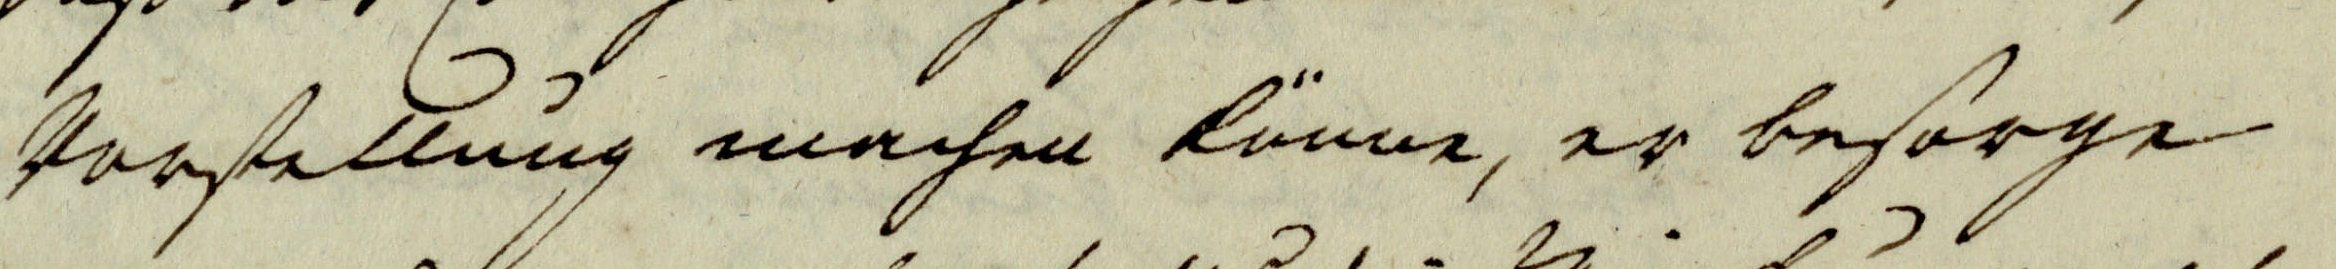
Vorstellung machen könne, er besorge
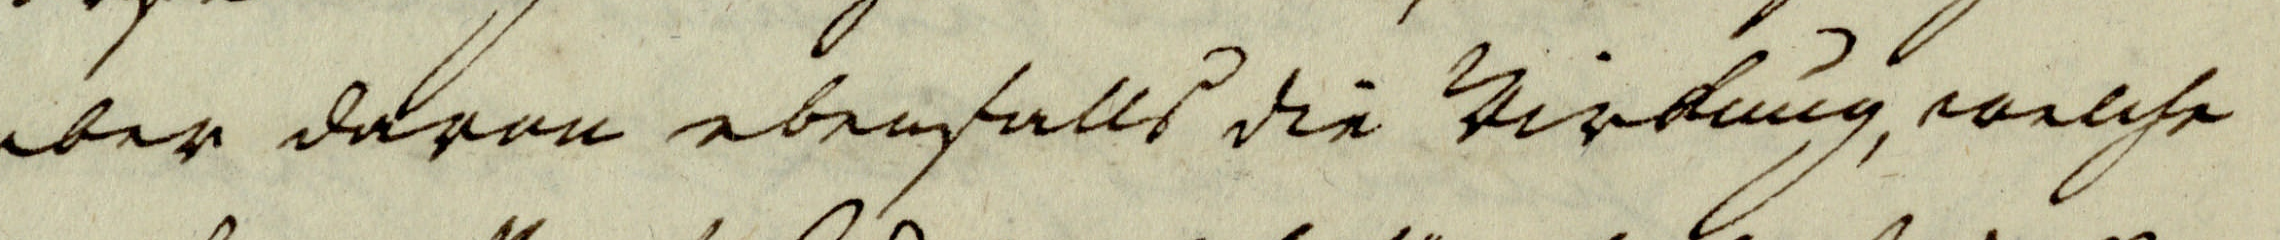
aber davon ebenfalls die Wirkung, welche
